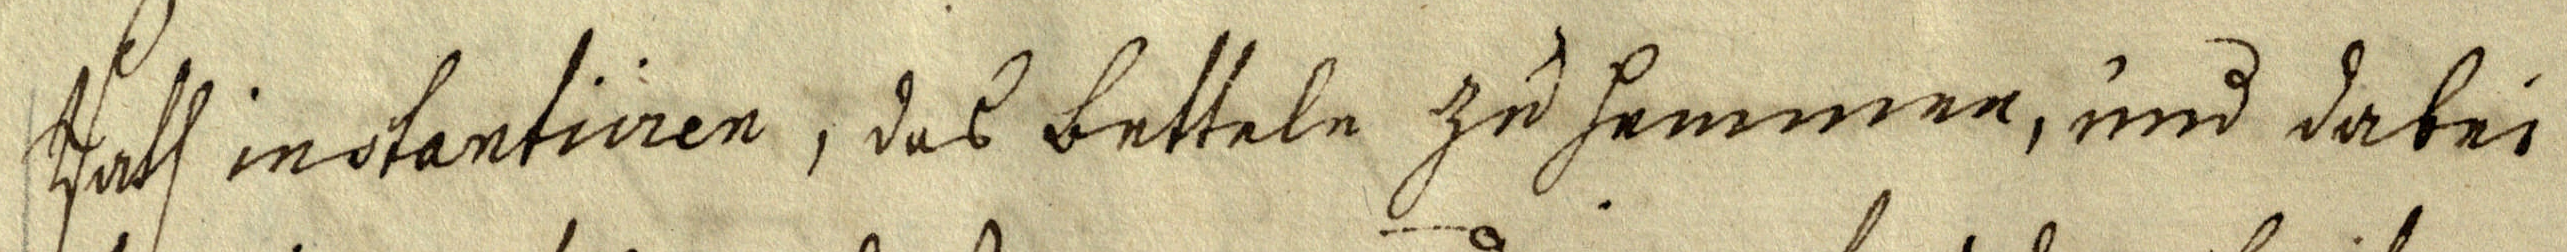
Rath instantiiren, das Betteln zu hemmen, und dabei
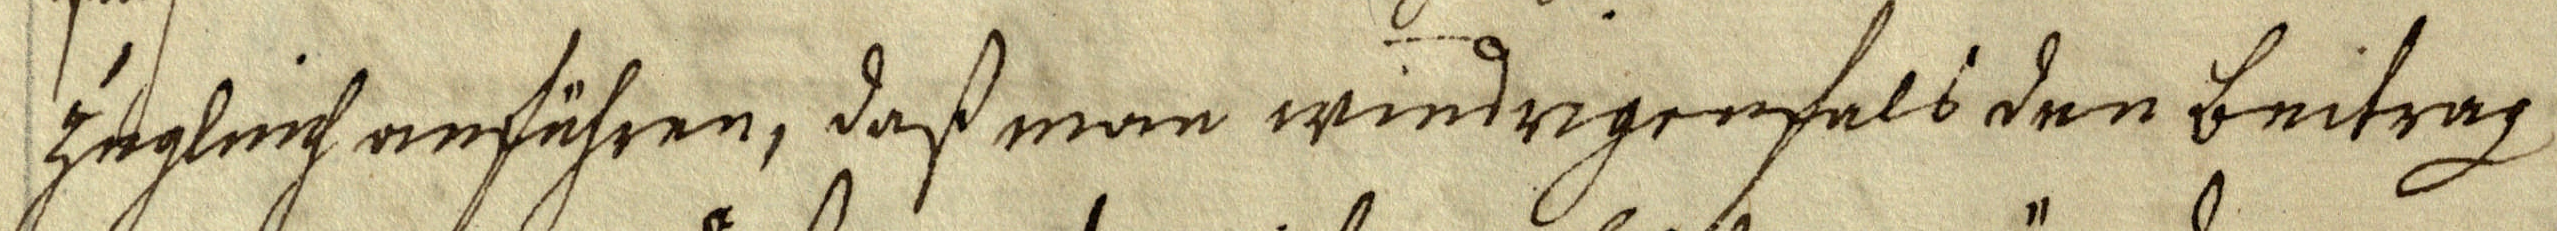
zugleich anführen, daß man wiedrigenfals den Beitrag
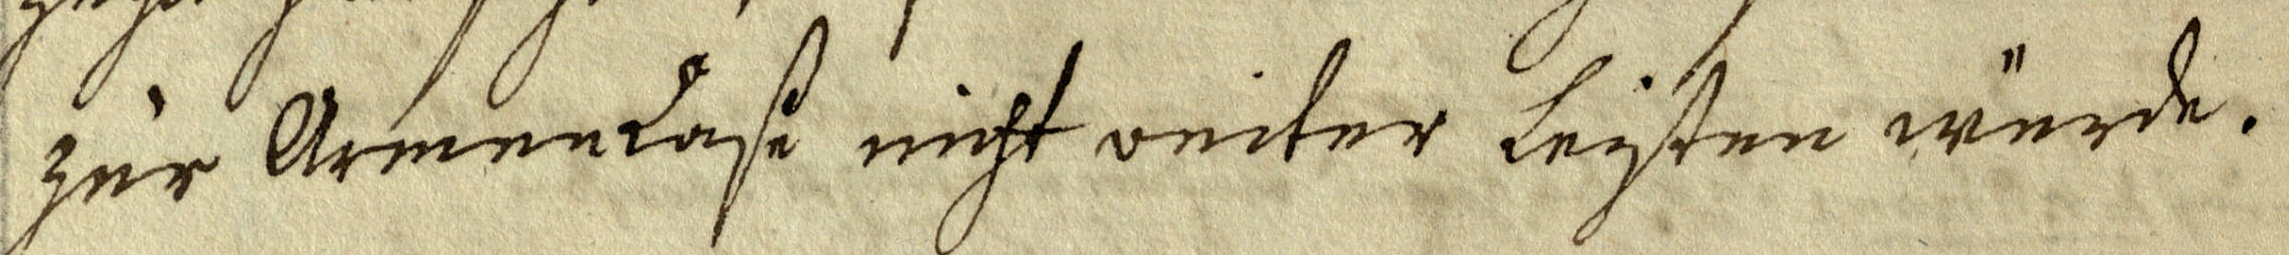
zur Armenkaße nicht weiter leisten würde.
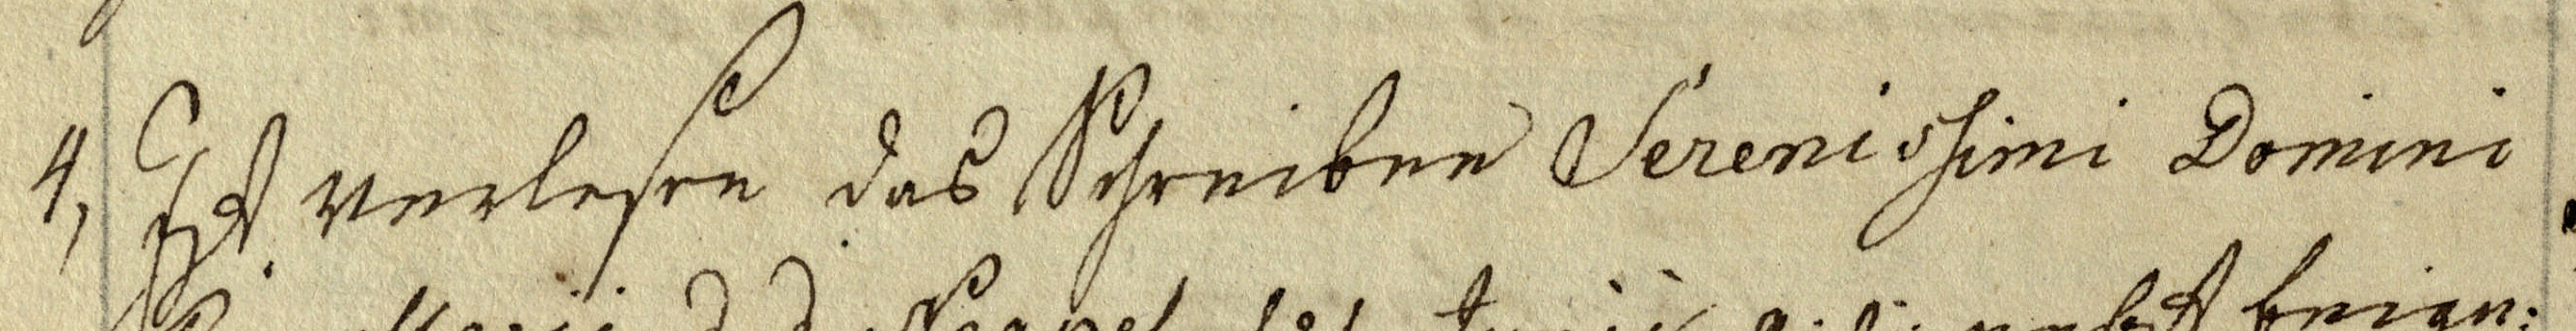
4. Ist verlesen das Schreiben Serenissimi Domini
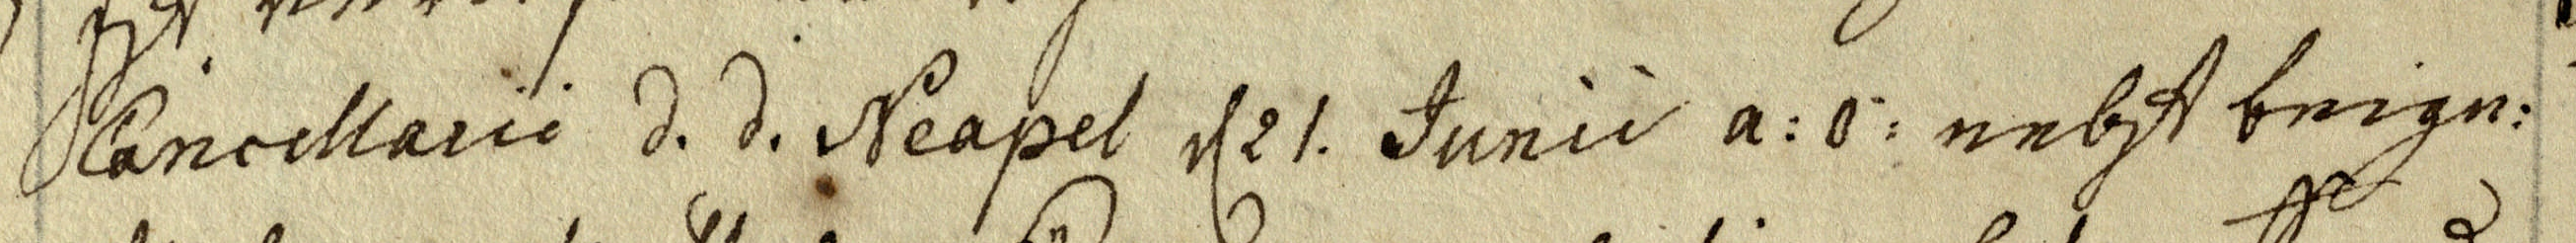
Cancellarii d. d. Neapel d 21. Junii a: c: nebst beige¬
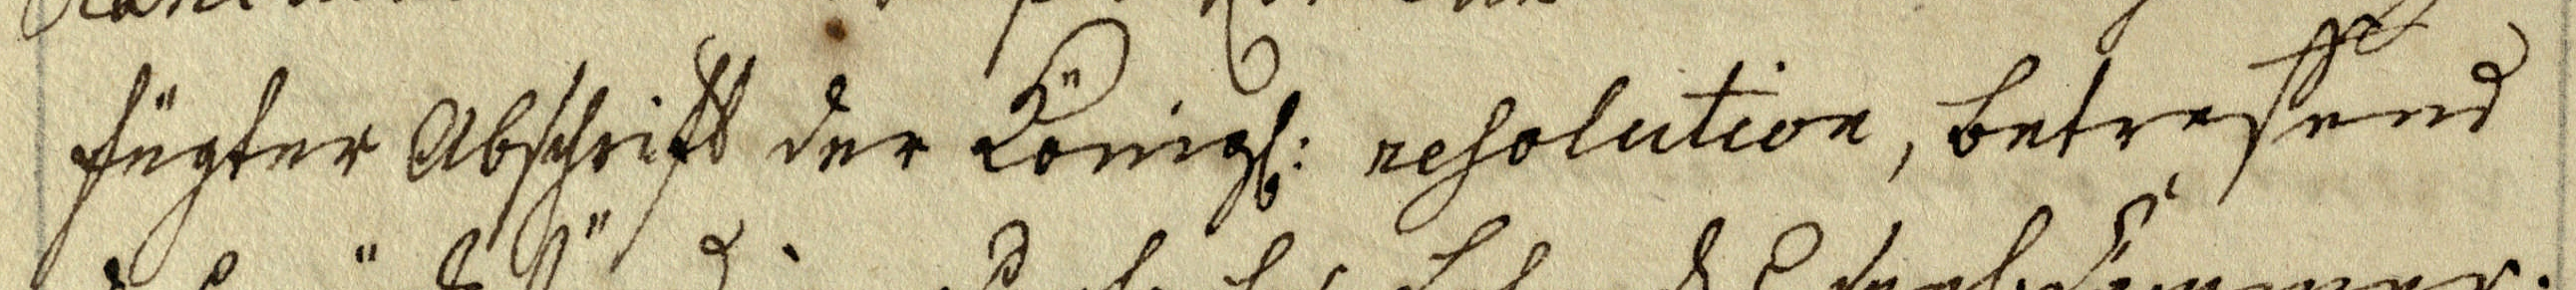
fügter Abschrift der Königl: resolution, betreffend
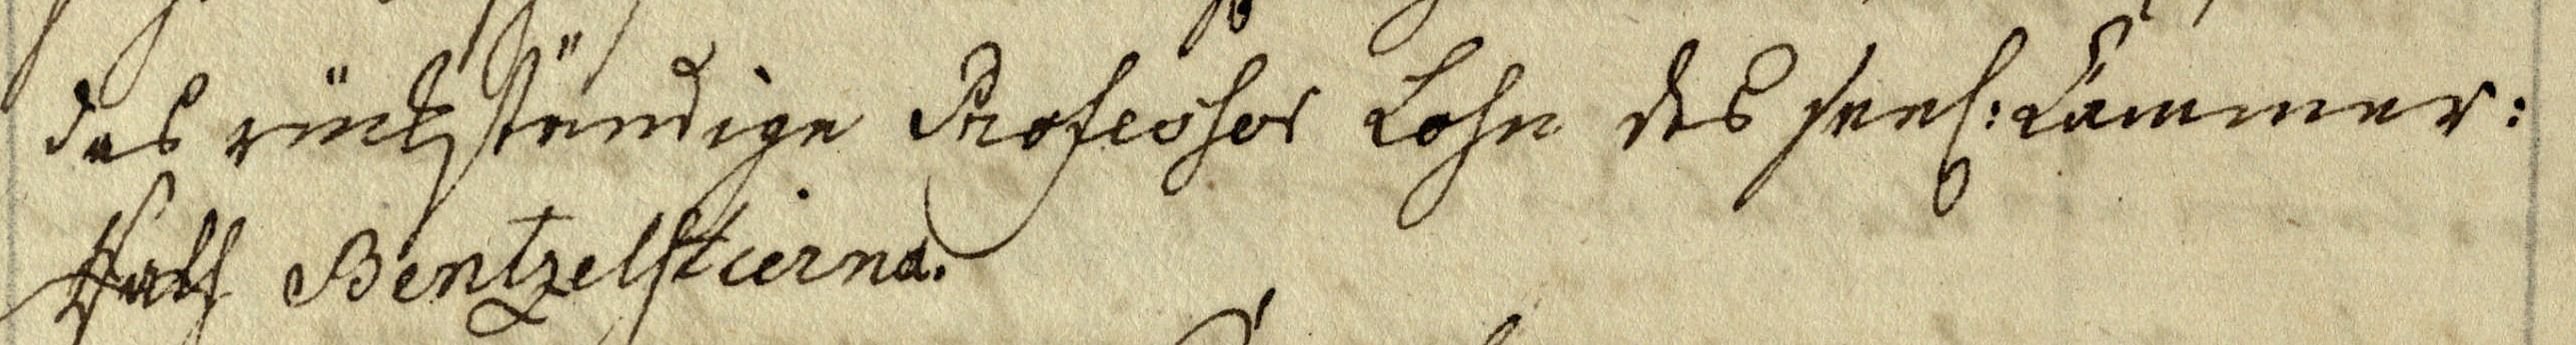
das rückständige Professor Lohn des seel: Cammer¬
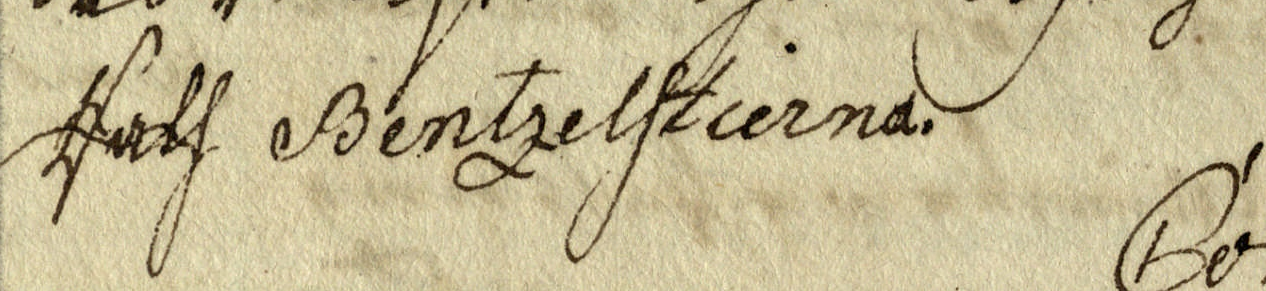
Rath Bentzelstierna.
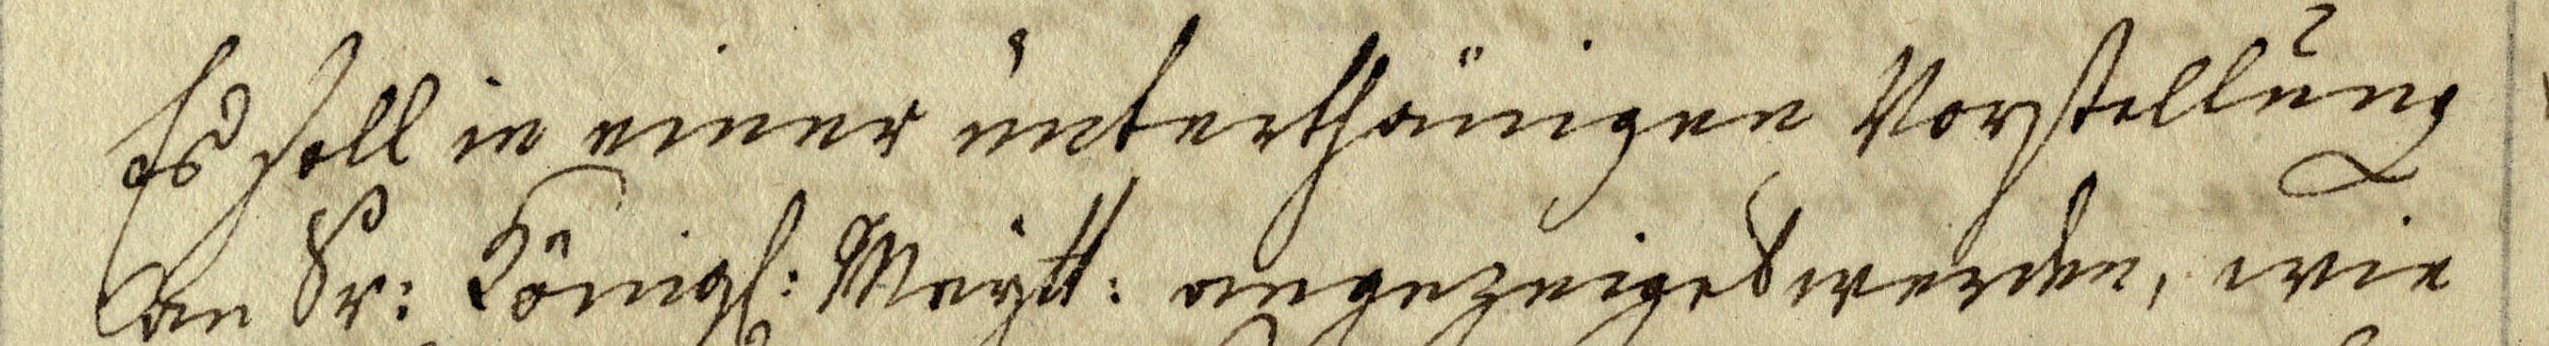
Es soll in einer unterthänigen Vorstellung
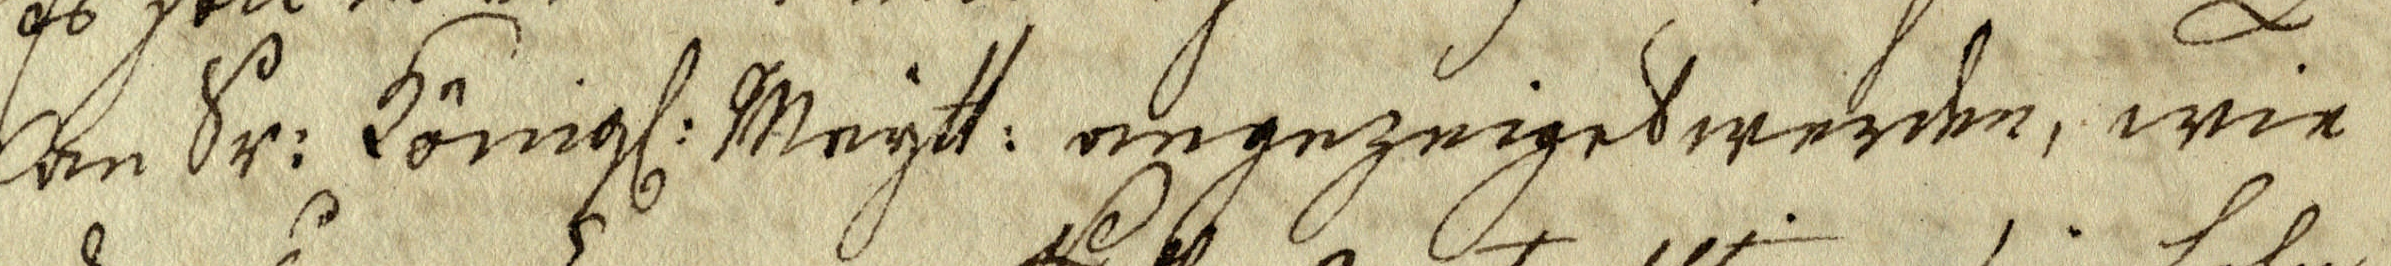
an Sr: Königl: Maÿtt: angezeiget werden, wie
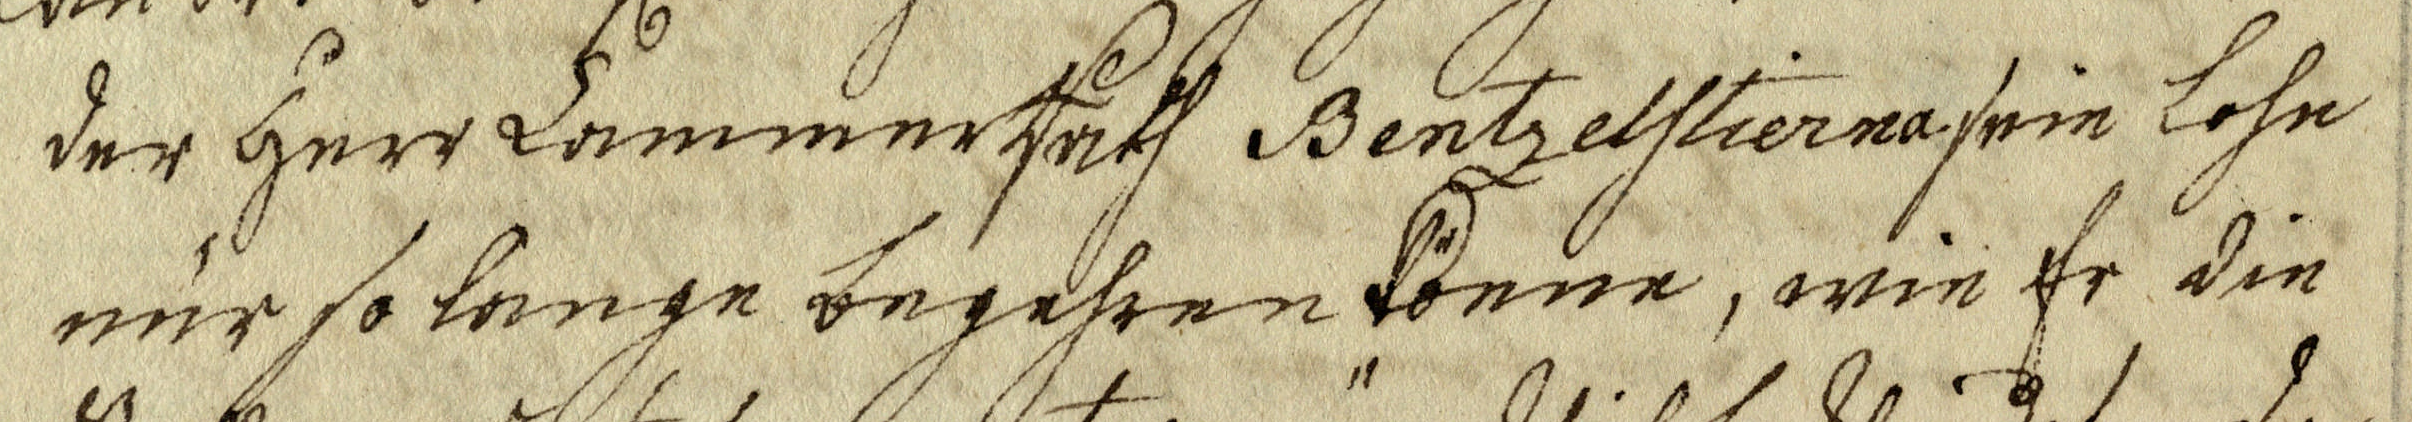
der Herr CammerRath Bentzelstierna sein Lohn
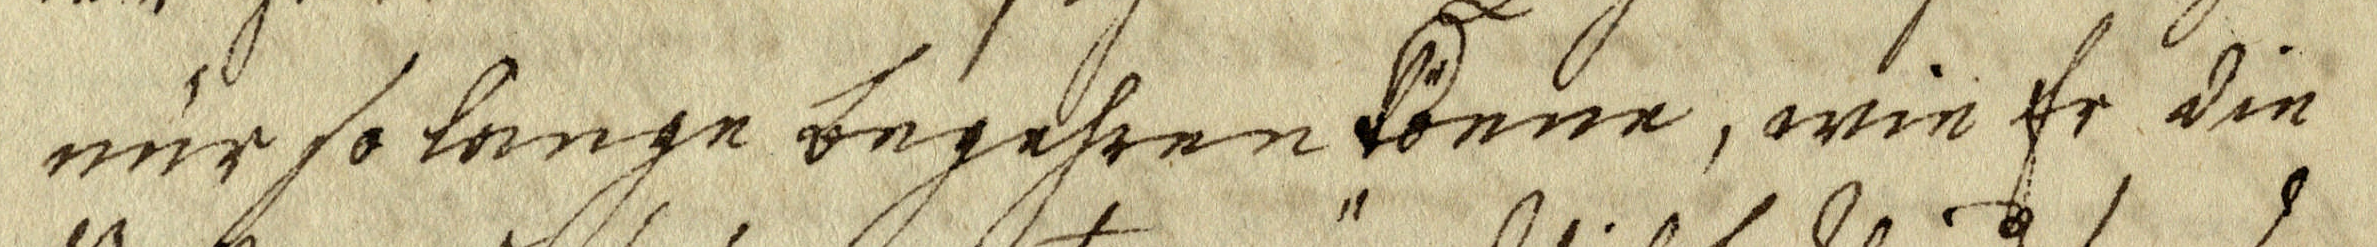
nur so lange begehren könne, wie Er die
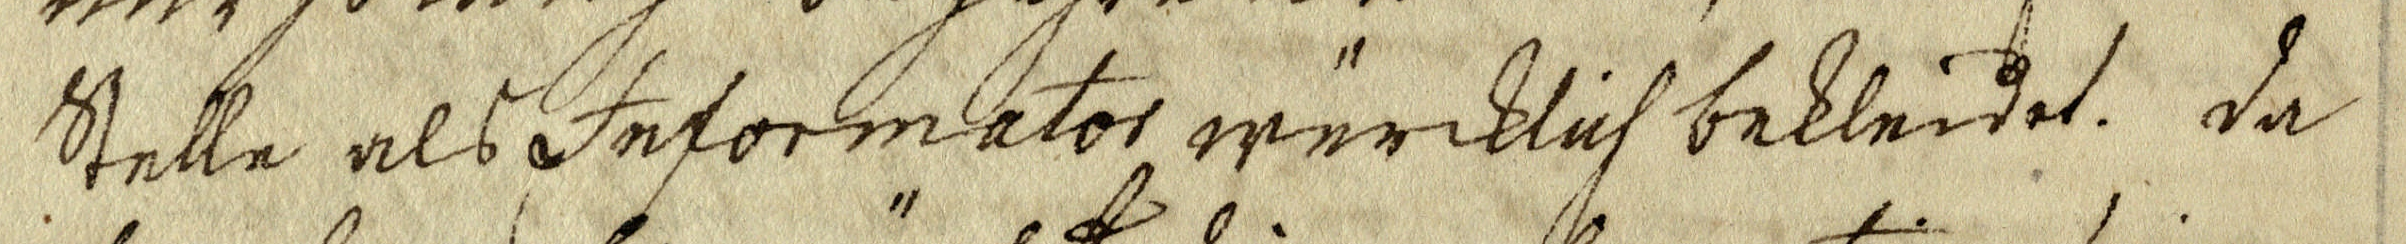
Stelle als Informator würcklich bekleidet. Da
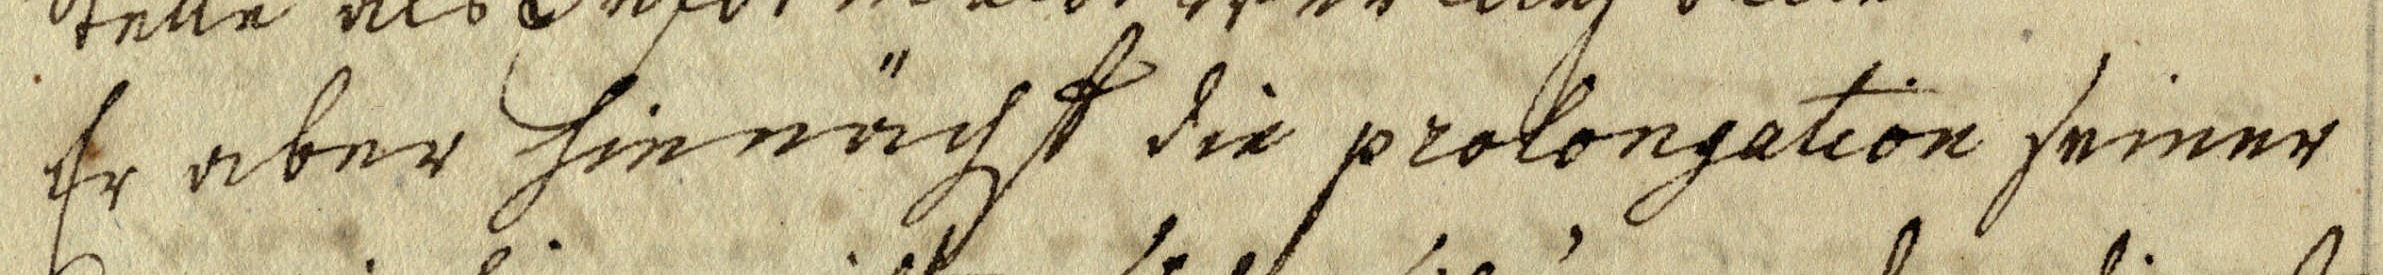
Er aber hienächst die prolongation seiner
